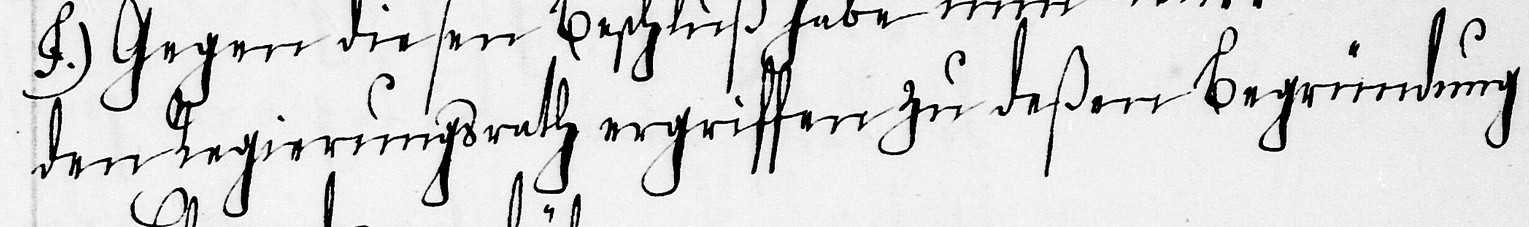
den Regierungsrath ergriffen zu deßen Begründung
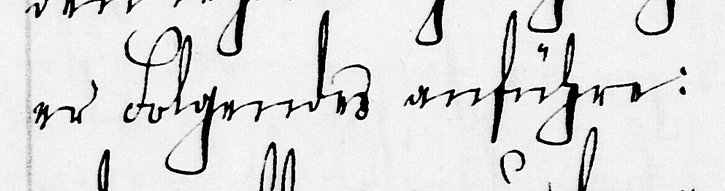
er Folgendes anführe:
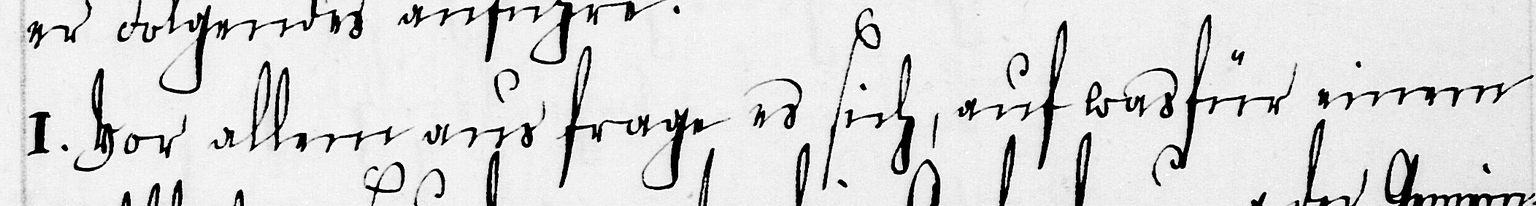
I. Vor allem aus frage es sich, auf was für einem
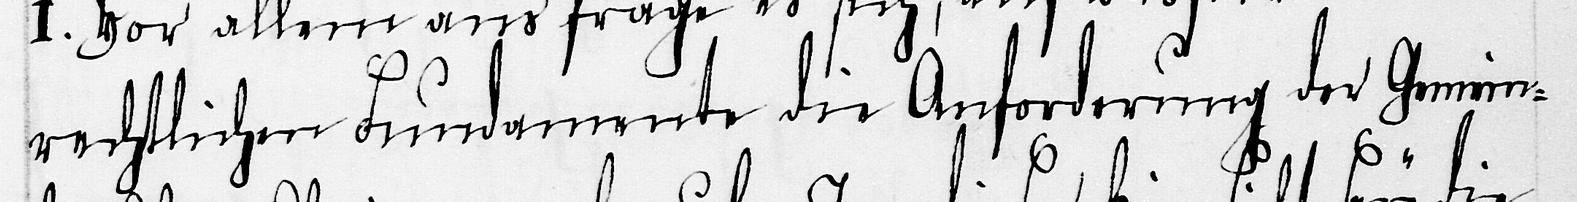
rechtlichen Fundamente die Anforderung der Gemein¬
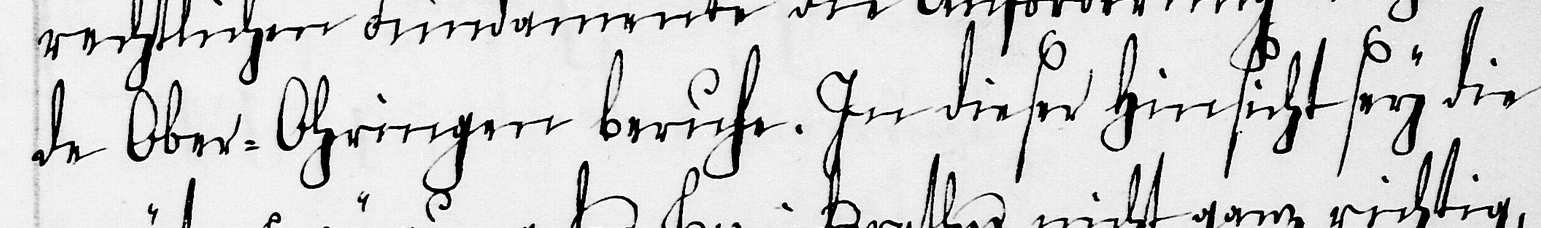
de Ober-Ohringen berufe. In dieser Hinsicht sey die
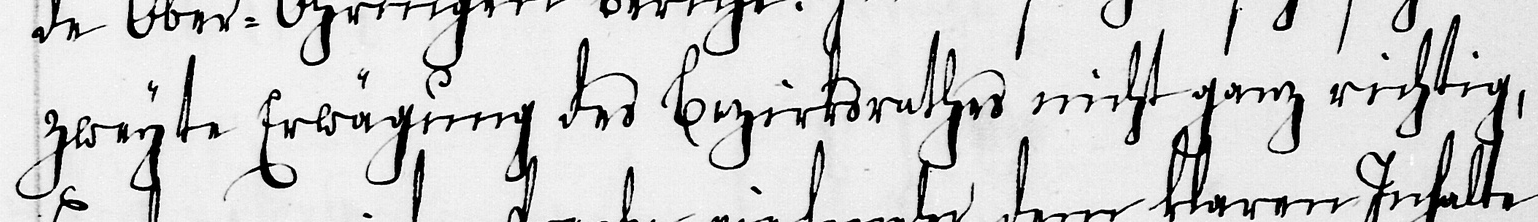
zweyte Erwägung des Bezirksrathes nicht ganz richtig,
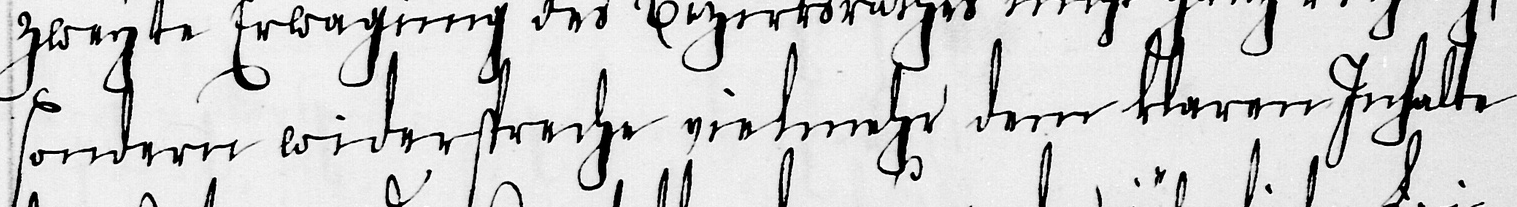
sondern widerspreche vielmehr dem klaren Inhalte
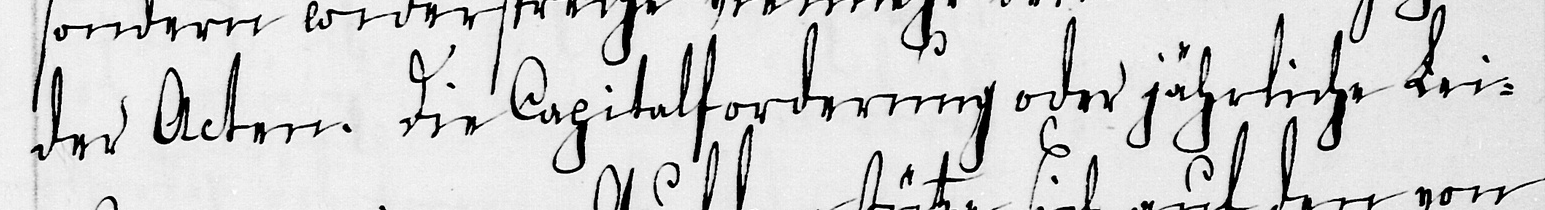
der Acten. Die Capitalforderung oder jährliche Lei¬
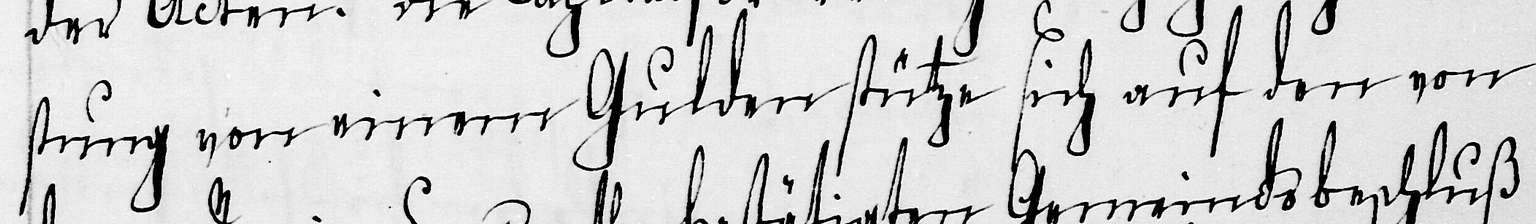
stung von einem Gulden stütze sich auf den von
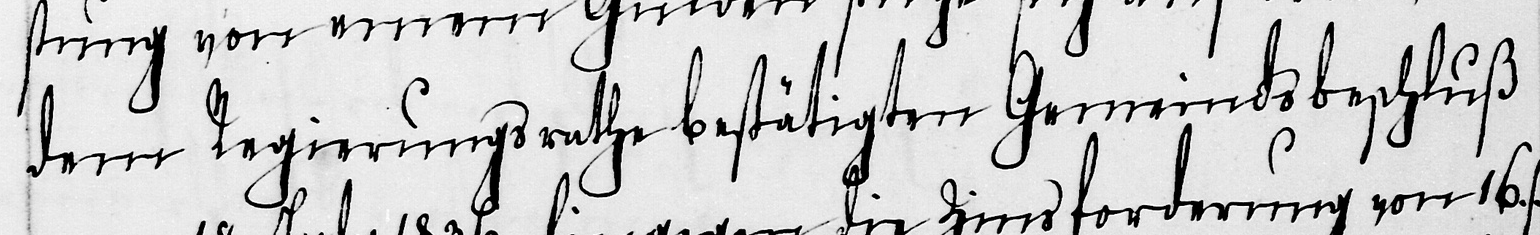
dem Regierungsrathe bestätigten Gemeindsbeschluß
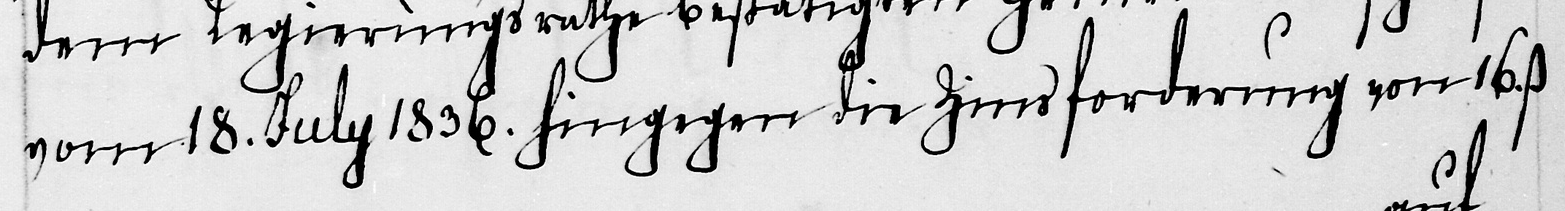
vom 18. July. 1836. hingegen die Zinsforderung von 16. ß
